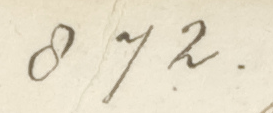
872.
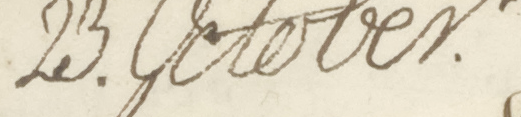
23. October.
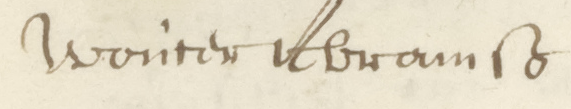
Wouter abrams
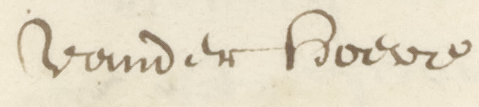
vander Hoeve
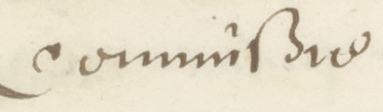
Commissie
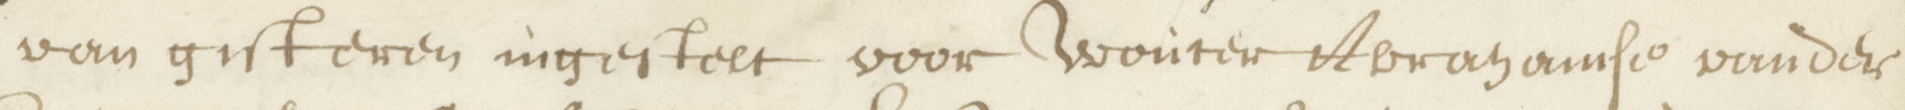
van gisteren ingestelt voor Wouter Abrahamse vander
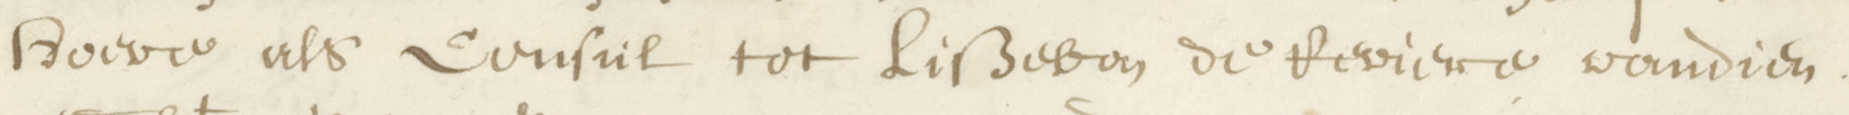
Hoeve als Consul tot Lissebon de Reviere vandien
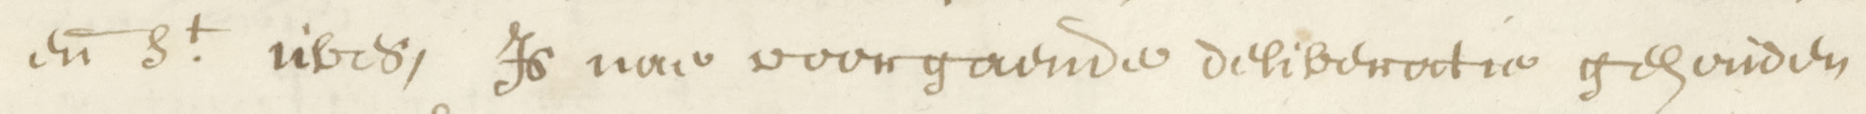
en st. ubes. Is nae voorgaende deliberatie gehouden
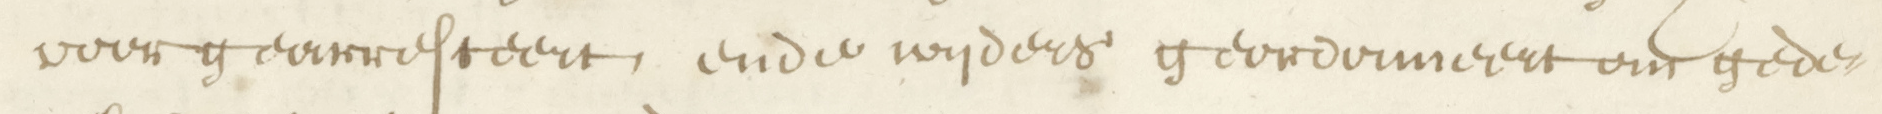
voor gearresteert, ende wyders geordonneert om gede„
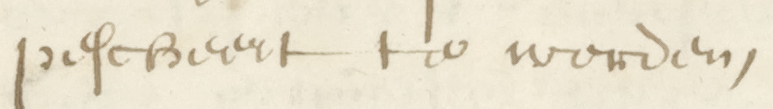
pescheert te worden.
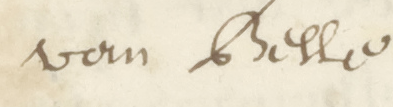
van Belle
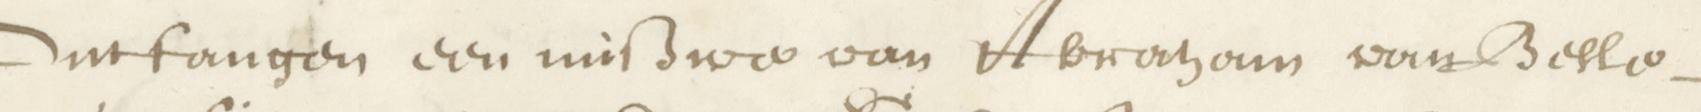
Ontfangen een missive van Abraham van Belle
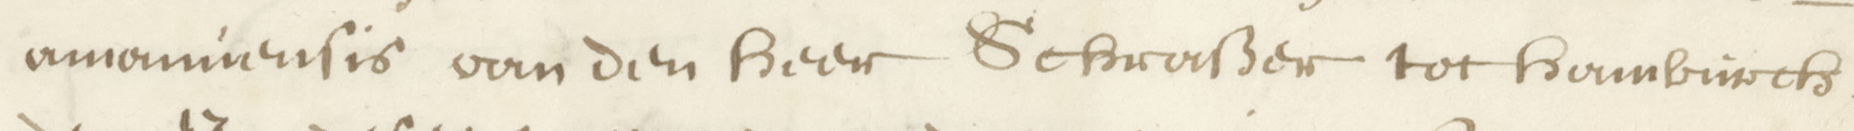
amanuensis van den Heer Schrasser tot Hamburch
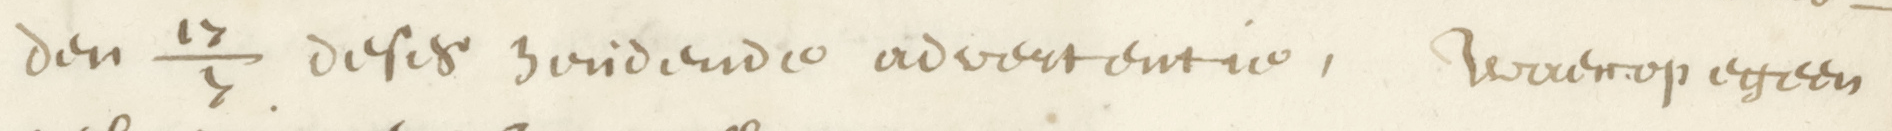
den 17/7. deses houdende advertentie. Waerop egeen
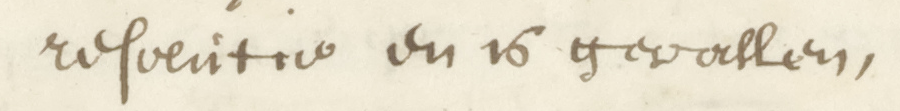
resolutie en is gevallen.
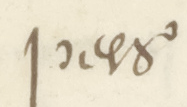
Pels
